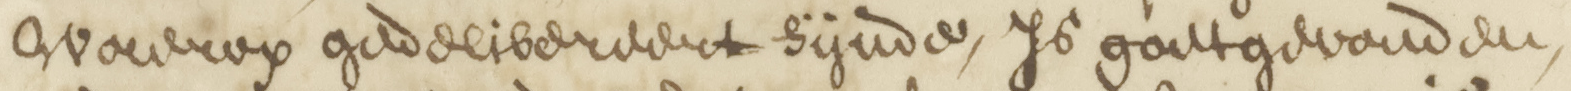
Waerop gedelibereert sijnde, Is goetgevonden,
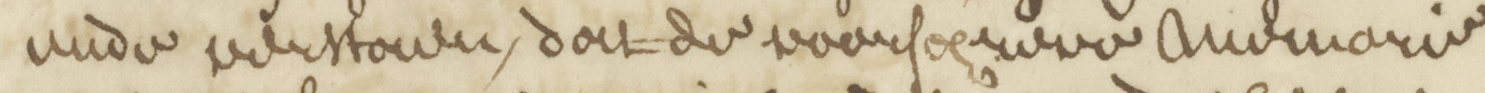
ende verstaen, dat de voorschreve Memorie
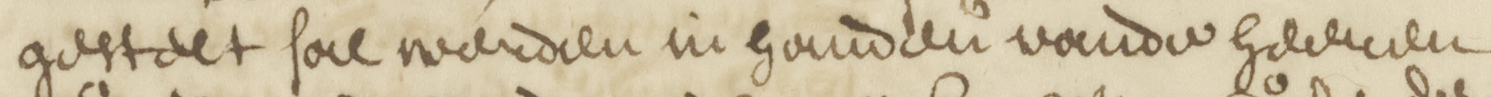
gestelt sal werden in handen vande heeren
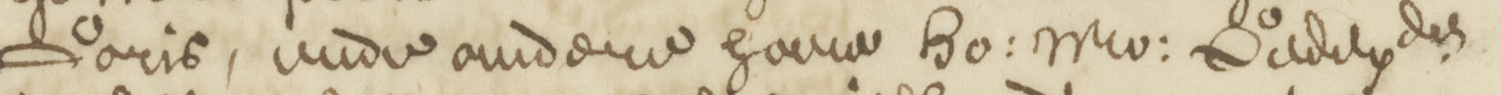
Goris, ende andere hare Ho:Mo: Gedepden.
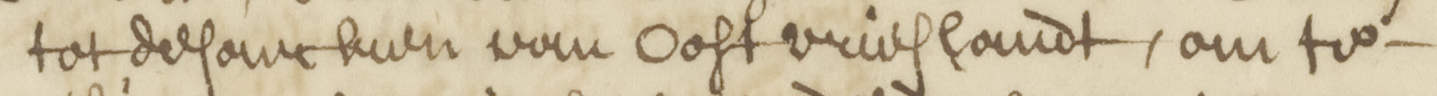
tot de saecken van Oostvrieslandt, om te —
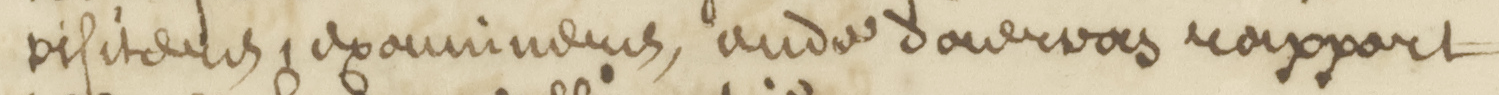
visiteren, examineren, ende daervan rapport
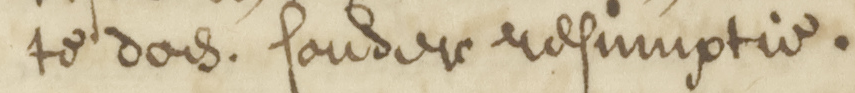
te doen. sonder resumptie.
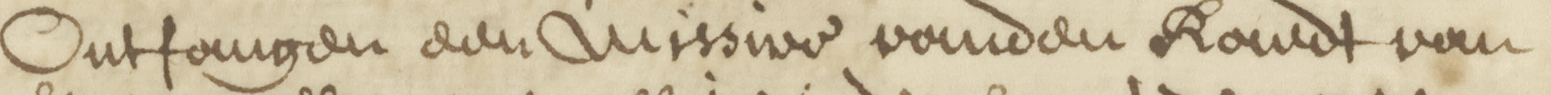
Ontfangen een Missive vanden Raedt van
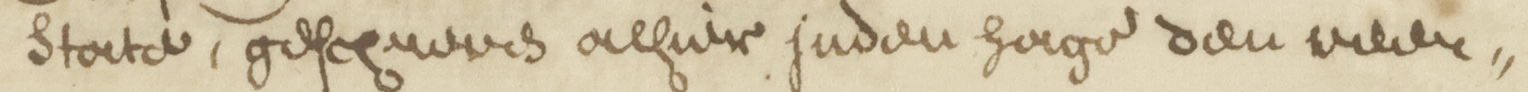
State, geschreven alhier inden hage den veer„
